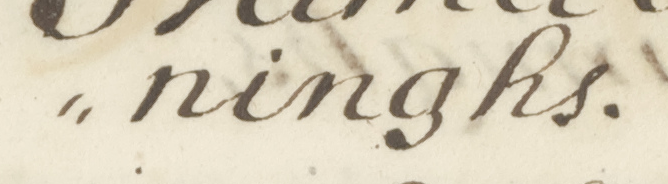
,,ninghs.
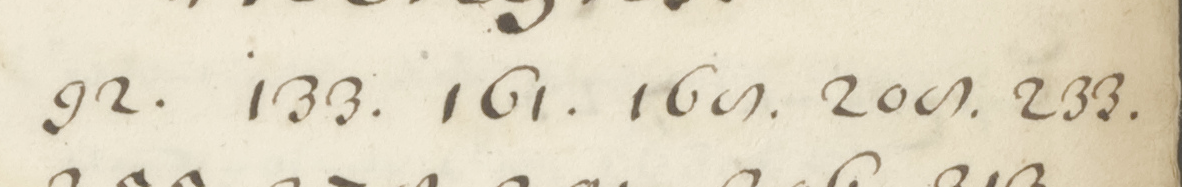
92, 133, 161, 168, 208, 233,
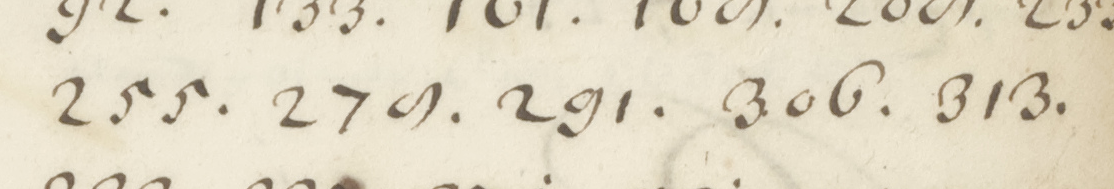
255, 278, 291, 306, 313.
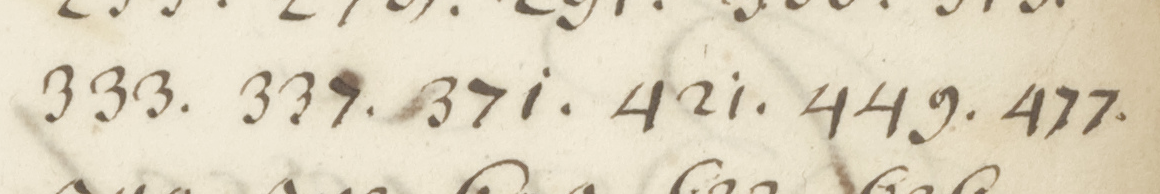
333, 337, 371, 421, 449, 477.
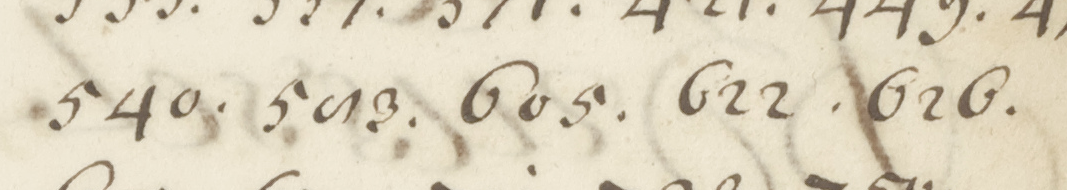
540, 583, 605, 622, 626.
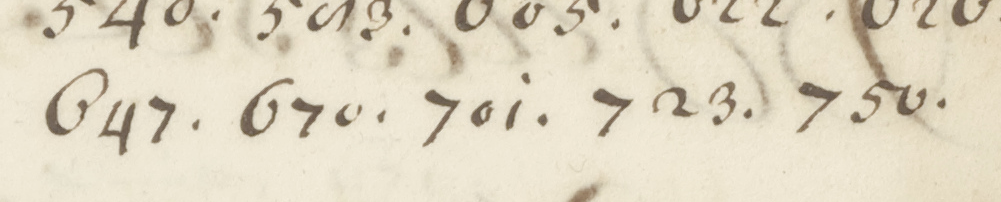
647, 670, 701, 723, 750.
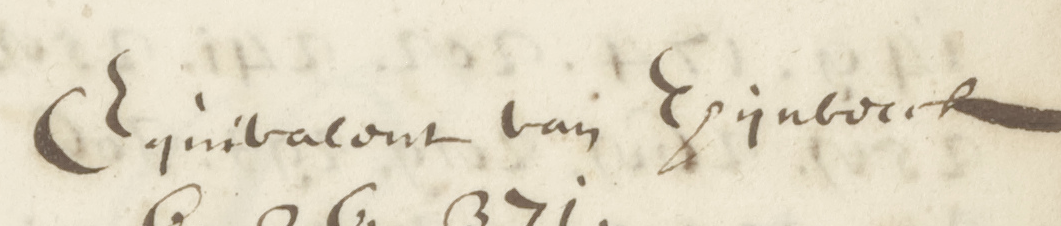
Equivalent van Rhijnberck
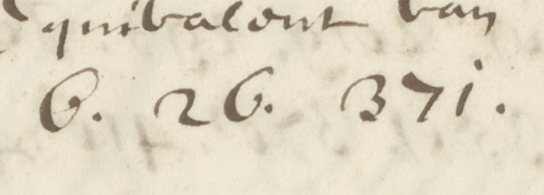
6, 26, 371.
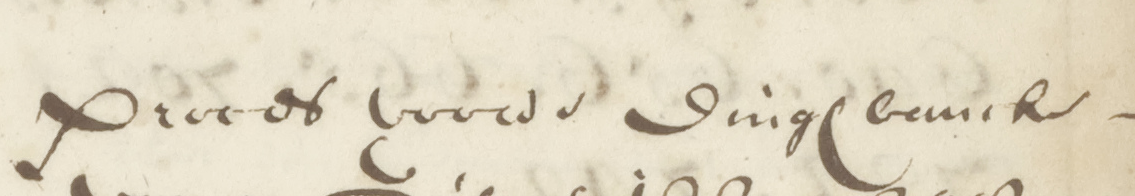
Proces voorde Dinghbanck
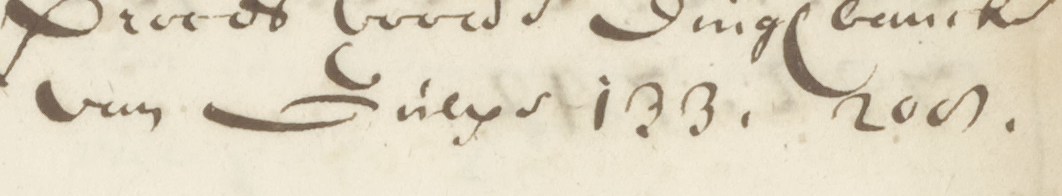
van Gulpe 133, 208.
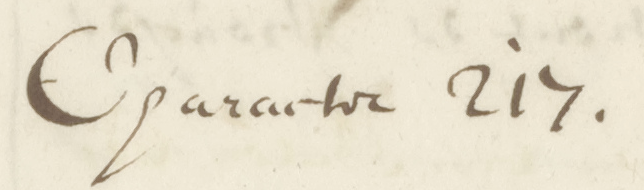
Character 217.
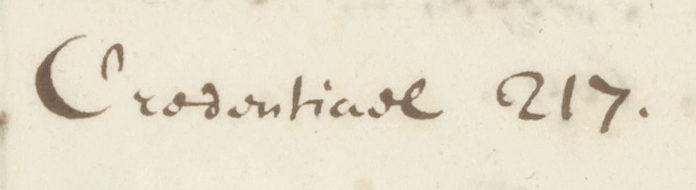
Credentiael 217.
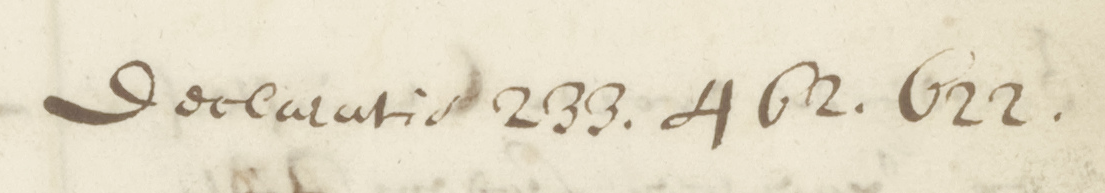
Declaratie 233, 462, 622.
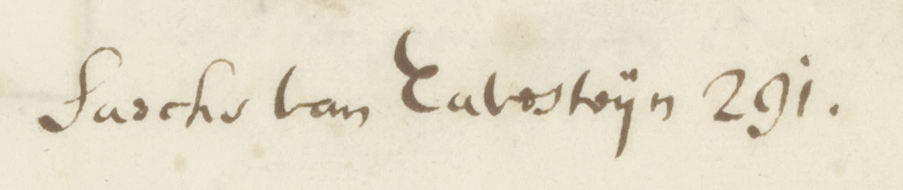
Saecke van ravesteijn 291.
